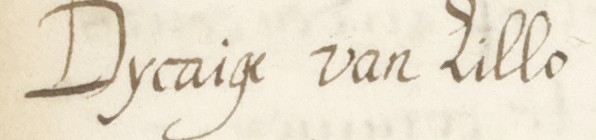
Dycaige van Lillo
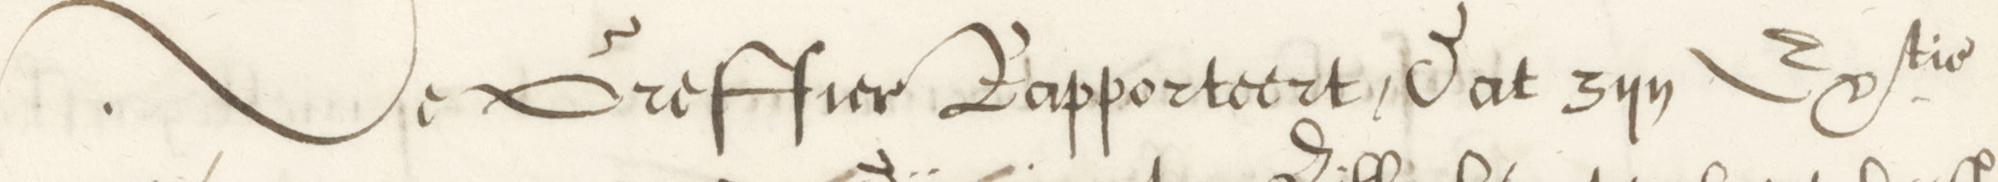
De Greffier Rapporteert, dat zyn Extie.
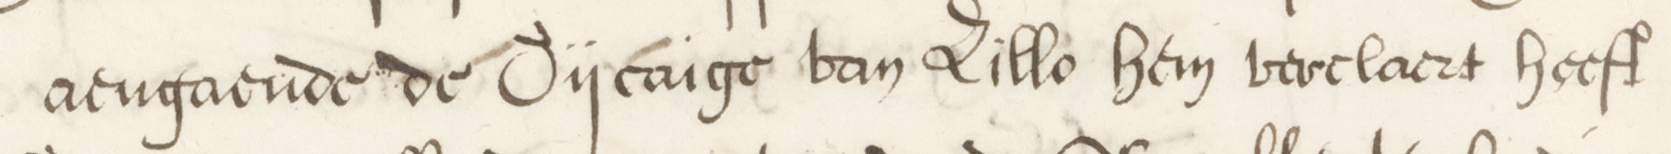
aengaende de Dijcaige van Lillo hem verclaert heeft
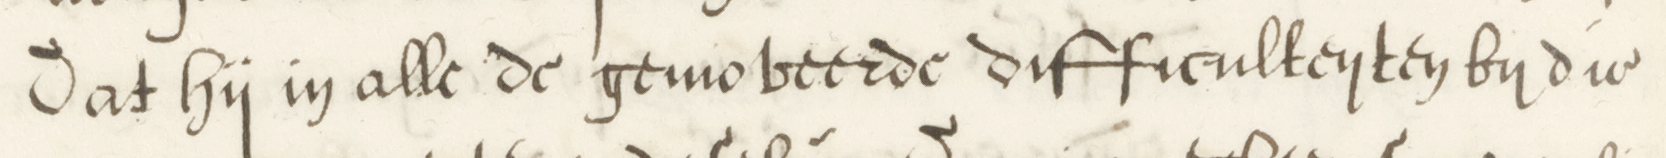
dat hij in alle de gemoveerde difficulteyten by die
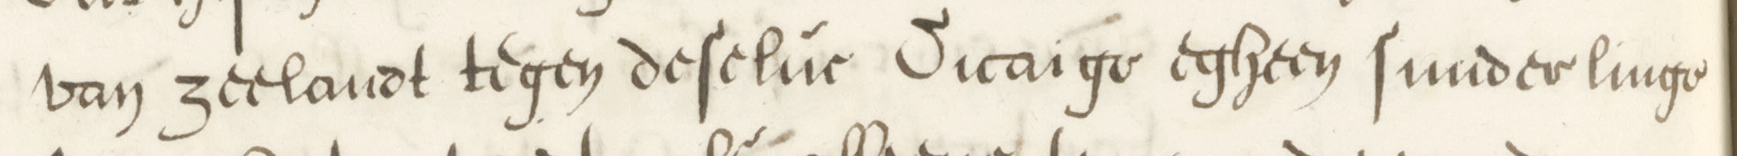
van Zeelandt tegen deselue Dicaige egheen sunderlinge
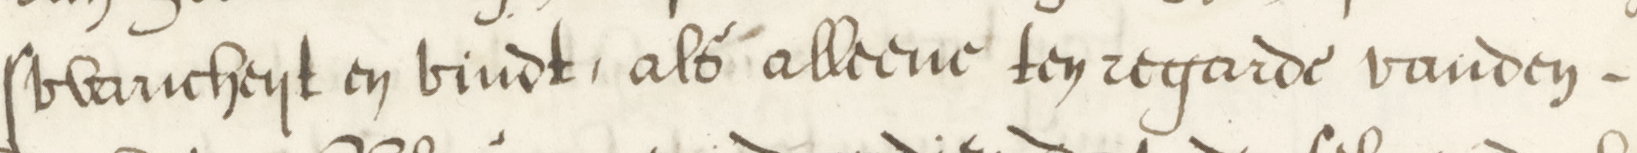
swaricheyt en vindt, als alleene ten regarde vanden
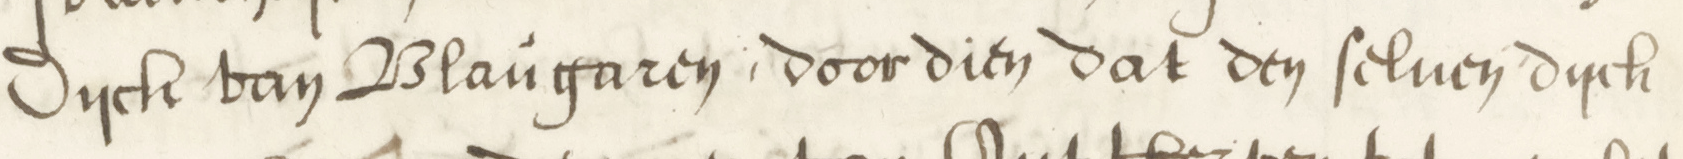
Dyck van Blaugaren, door dien dat den seluen dyck
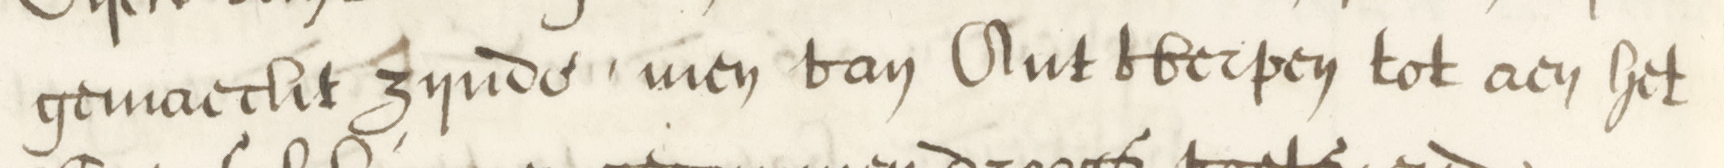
gemaeckt zynde, men van Antwerpen tot aen het
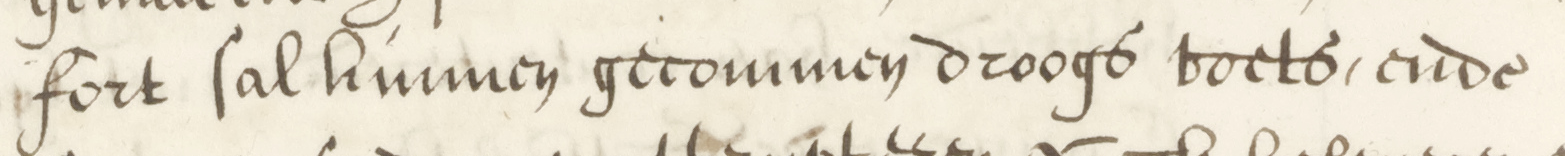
fort sal kunnen gecommen droogs voets, ende
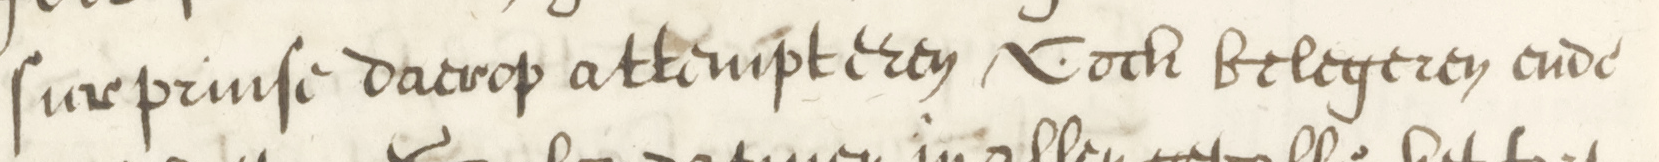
surprinse daerop attempteren. Oock belegeren ende
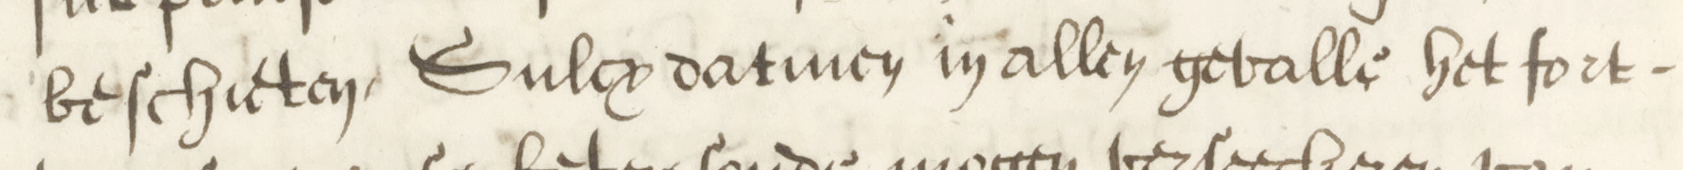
beschieten, Sulcx datmen in allen gevalle het fort
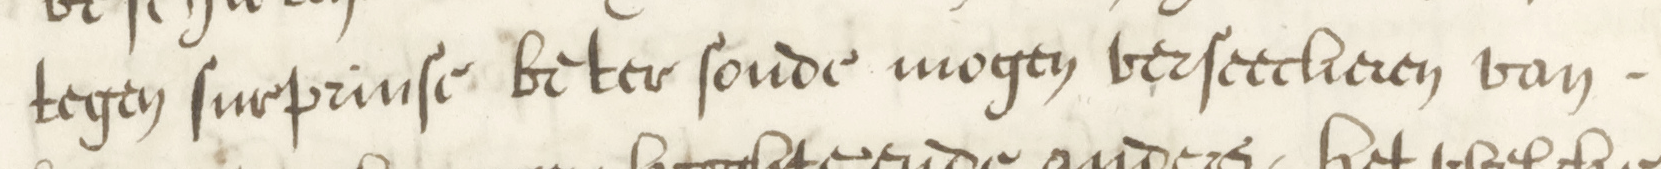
tegen surprinse beter soude mogen verseeckeren van
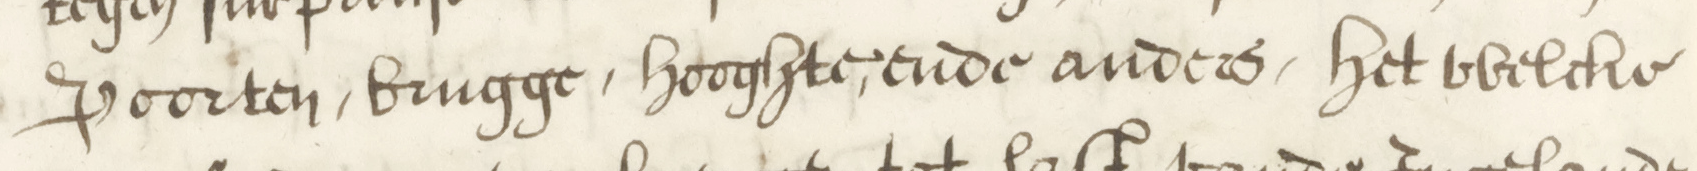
Poorten, brugge, hooghte, ende anders, het welcke
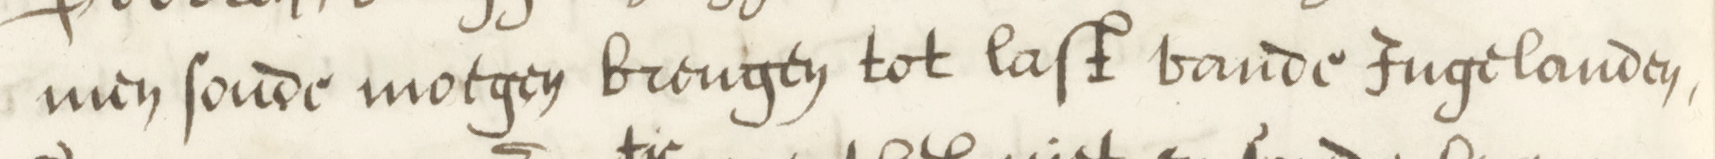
men soude moegen brengen tot last vande Ingelanden,
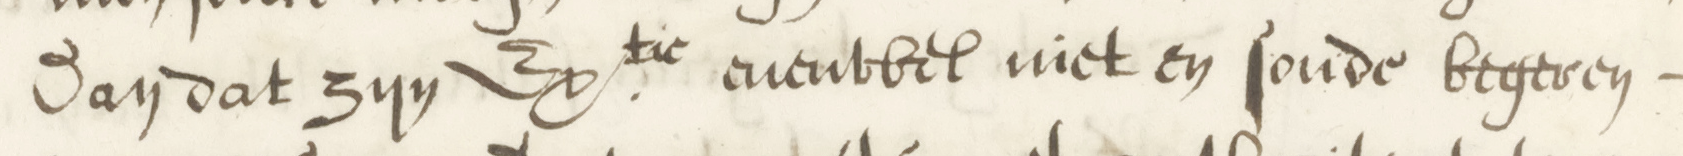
Dan dat zyn Extie. euenwel niet en soude begeren -
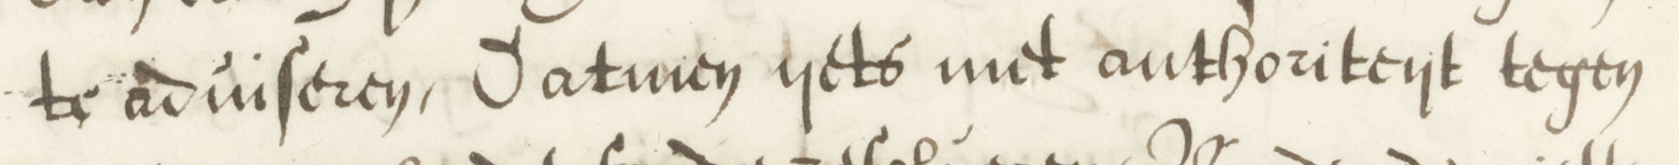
te aduiseren, datmen yets met authoriteyt tegen
